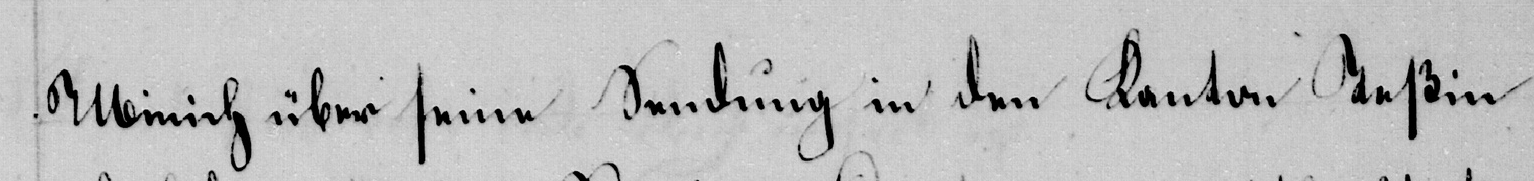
Minich über seine Sendung in den Kanton Teßin
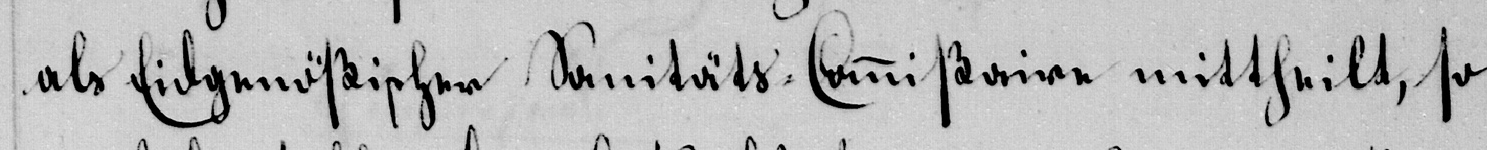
als Eidgenößischer Sanitäts-Commißaire mittheilt, so
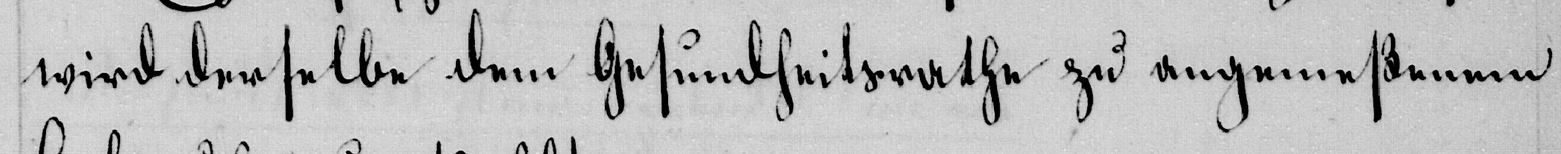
wird derselbe dem Gesundheitsrathe zu angemeßenem
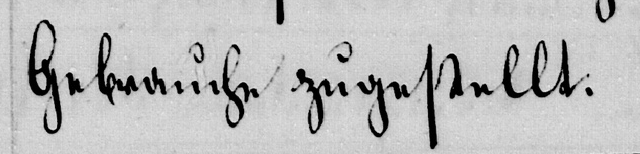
Gebrauche zugestellt.
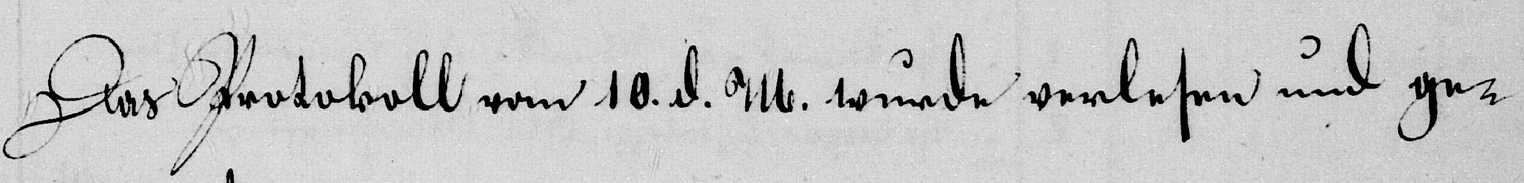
Das Protokoll vom 10. d. M. wurde verlesen und ge¬
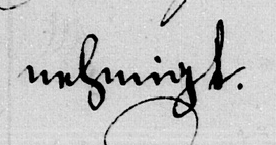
nehmigt.
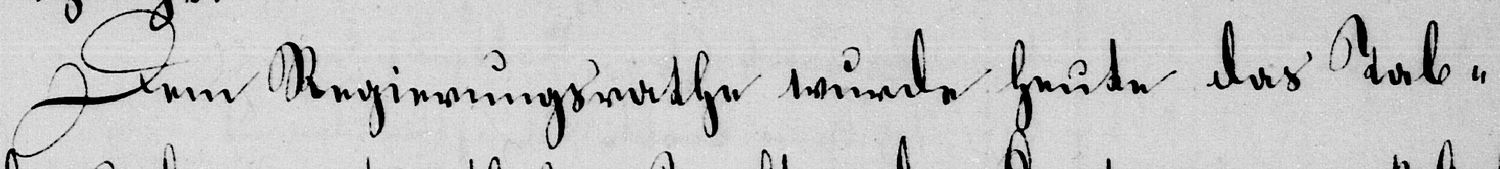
Dem Regierungsrathe wurde heute das Tab¬
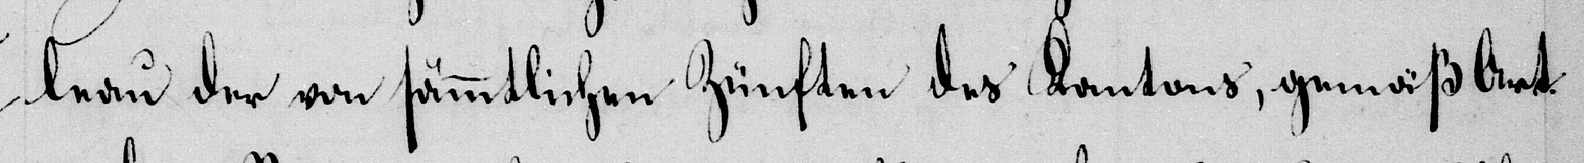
leau der von sämmtlichen Zünften des Kantons, gemäß Art.
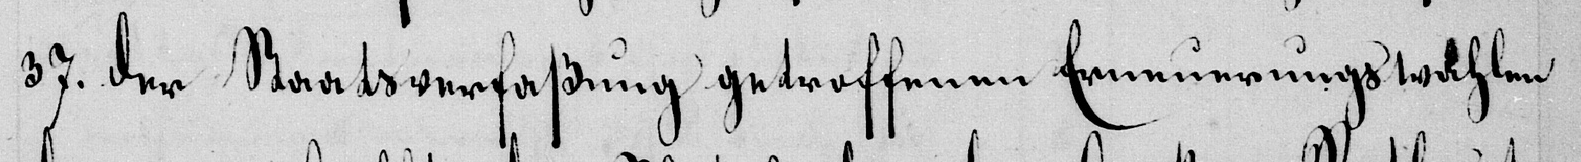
37. der Staatsverfassung getroffenen Erneuerungswahlen
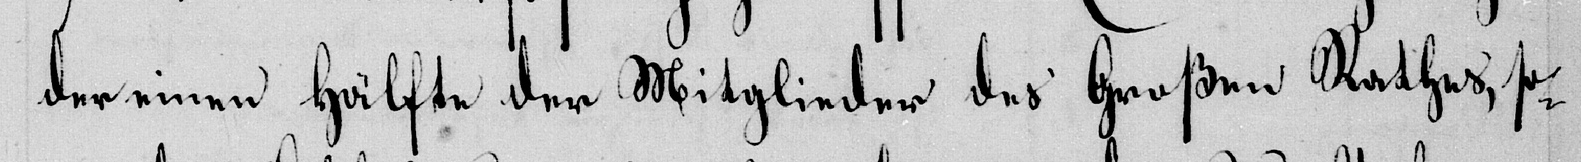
der einen Hälfte der Mitglieder des Großen Rathes, so¬
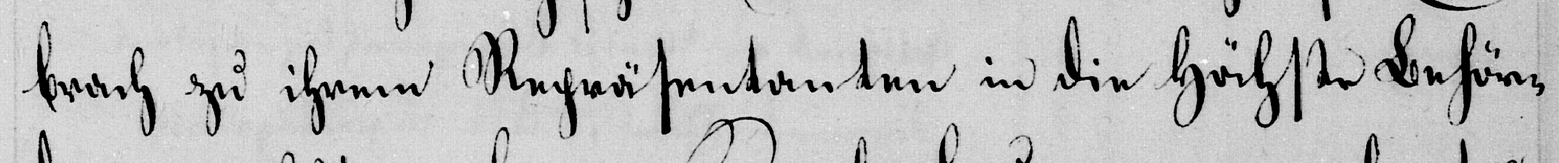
brach zu ihrem Repräsentanten in die Höchste Behör¬
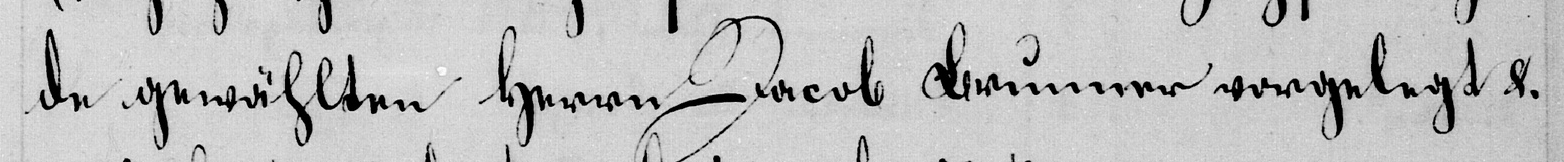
de gewählten Herrn Jacob Brunner vorgelegt &.
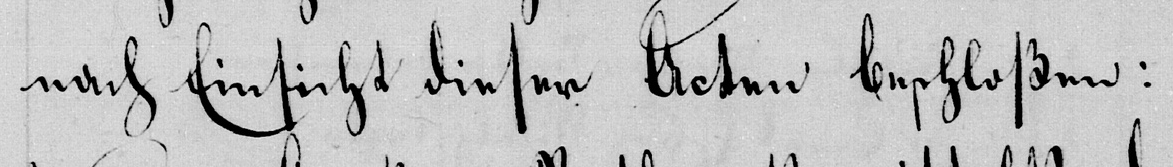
nach Einsicht dieser Acten beschloßen:
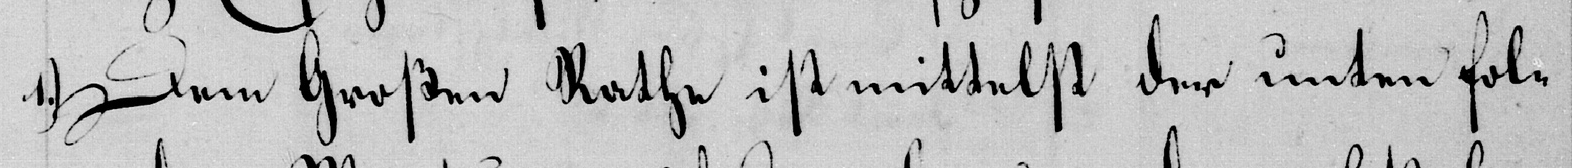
1.) Dem Großen Rathe ist mittelst der unter fol¬
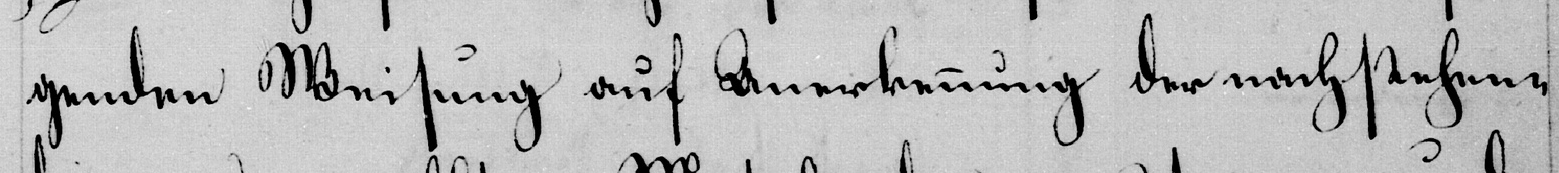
genden Weisung auf Anerkennung der nachstehen¬
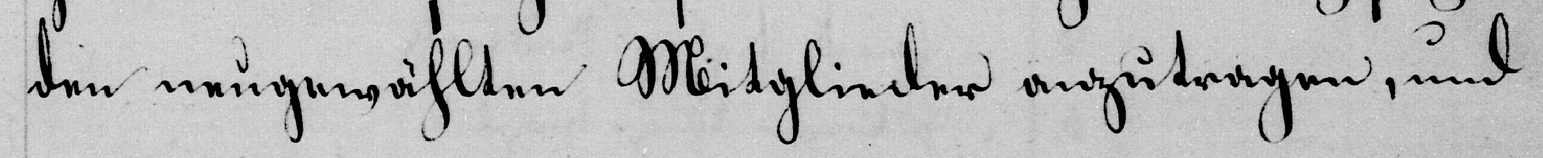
den neugewählten Mitglieder anzutragen, und
